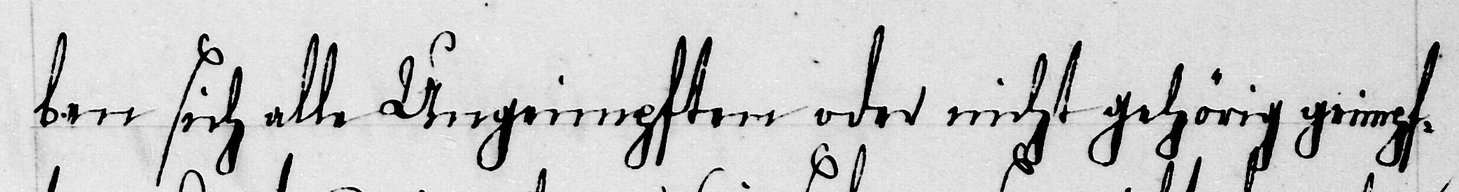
ben sich alle Ungeimpften oder nicht gehörig geimpf¬
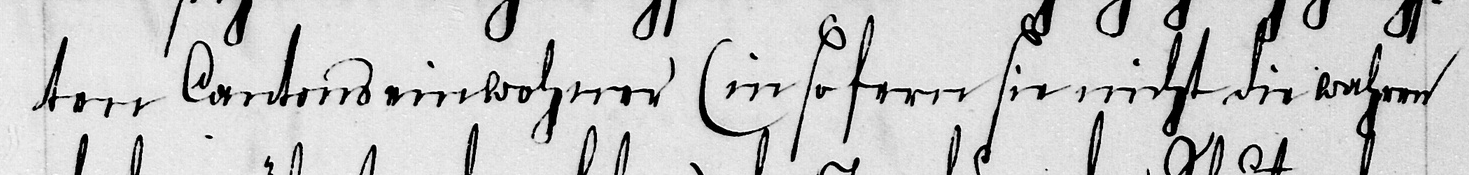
ten Cantonseinwohner (in so fern sie nicht die wahren
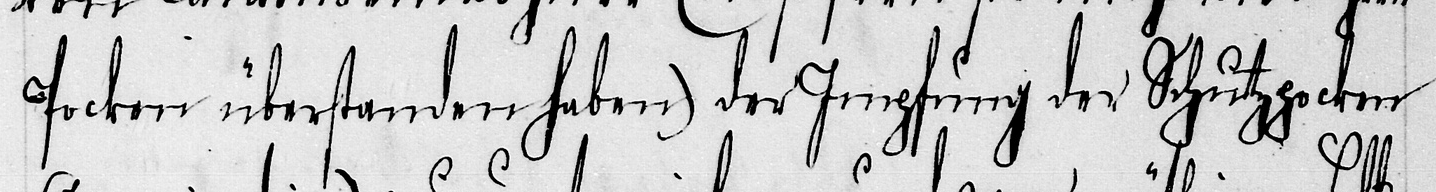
Pocken überstanden haben) der Impfung der Schutzpocken
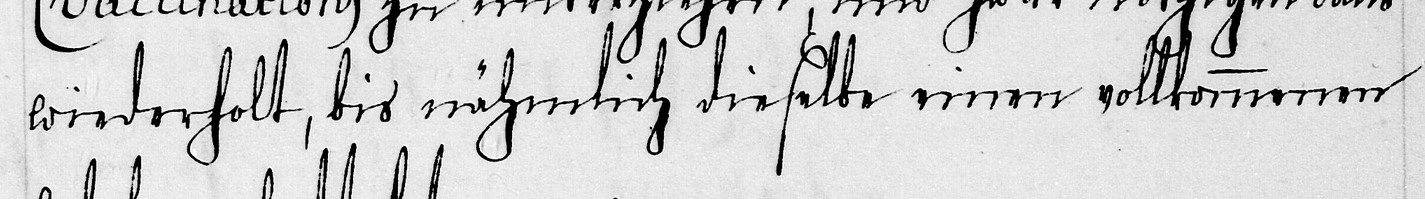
wiederholt, bis nähmlich dieselbe einen vollkommenen
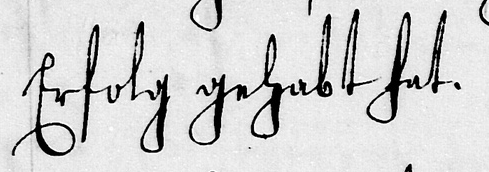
Erfolg gehabt hat.
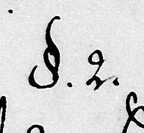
§. 2.
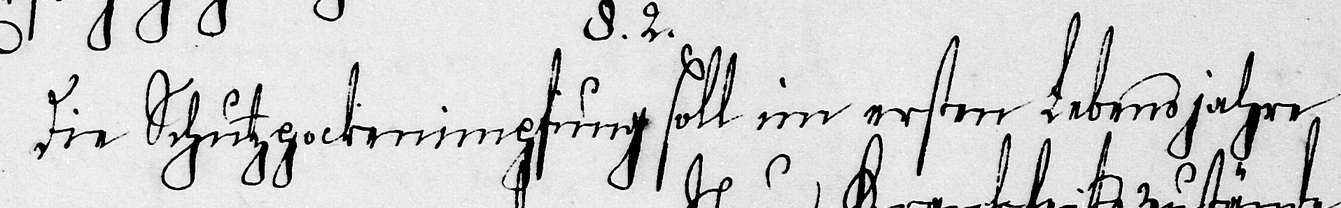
Die Schutzpockenimpfung soll im ersten Lebensjahre
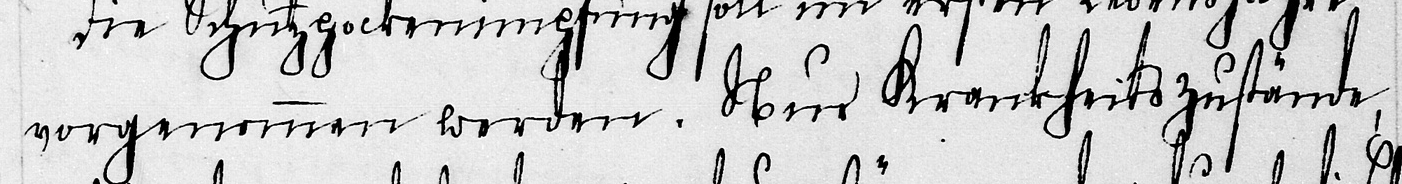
vorgenommen werden. Nur Krankheitszustände,
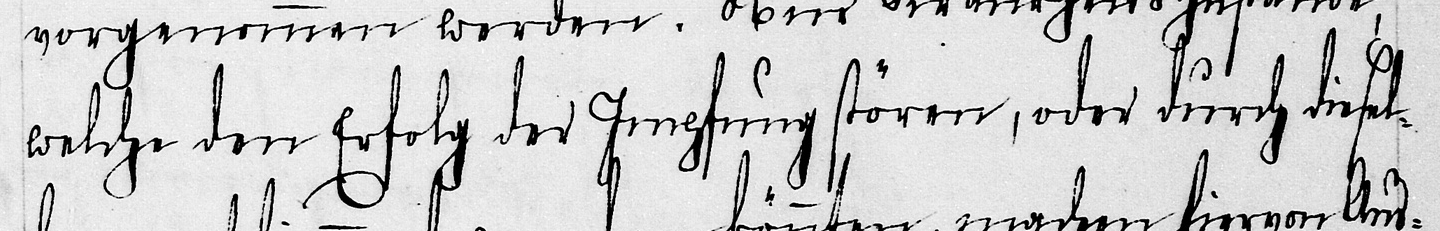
welche den Erfolg der Impfung stören, oder durch diese¬
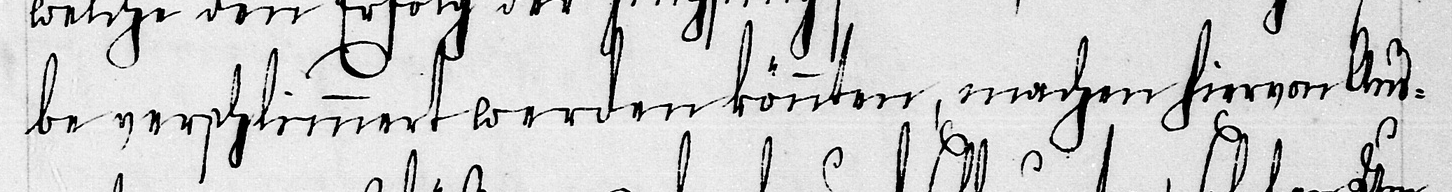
lbe verschlimmert werden könnten, machen hiervon Aus¬
